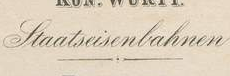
Staatseisenbahnen
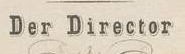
Der Director
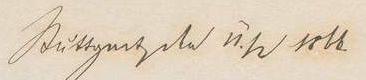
Stuttgart den 11. /2 1866
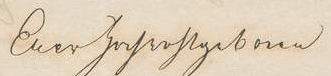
Euer Hochwohlgeboren
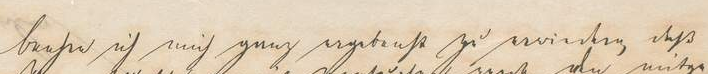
beehre ich mich ganz ergebenst zu erwiedern, daß
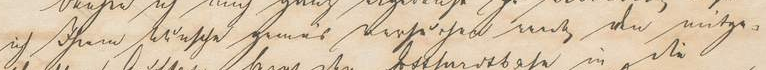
ich Ihrem Wunsche gemäs Versuchen werde, den mitge-
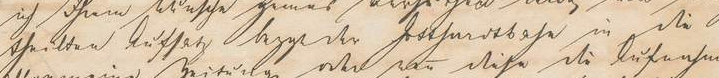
theilten Aufsatz bezgl der Gotthardtbahn in die
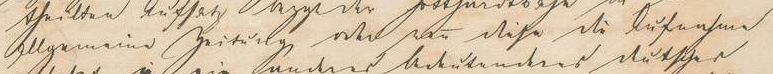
allgemeine Zeitung, oder wenn diese die Aufnahme
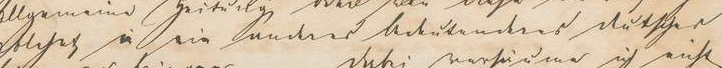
ablehnt, in ein anderes bedeutenderes deutsches
